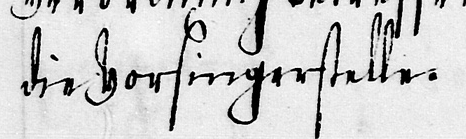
die Vorsingerstelle,
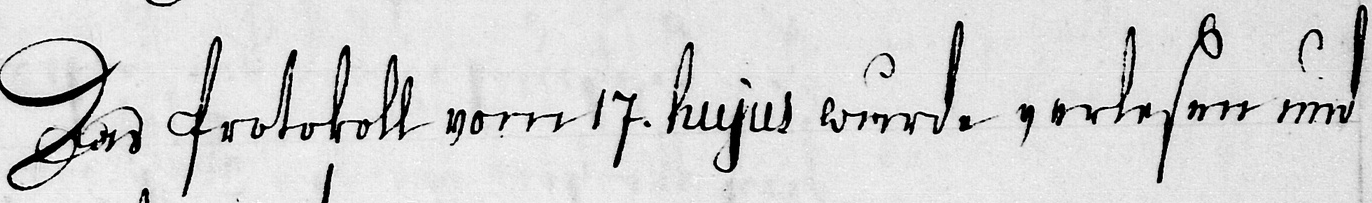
Das Protokoll vom 17. hujus wurde verlesen und
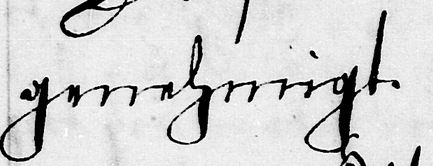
genehmigt.
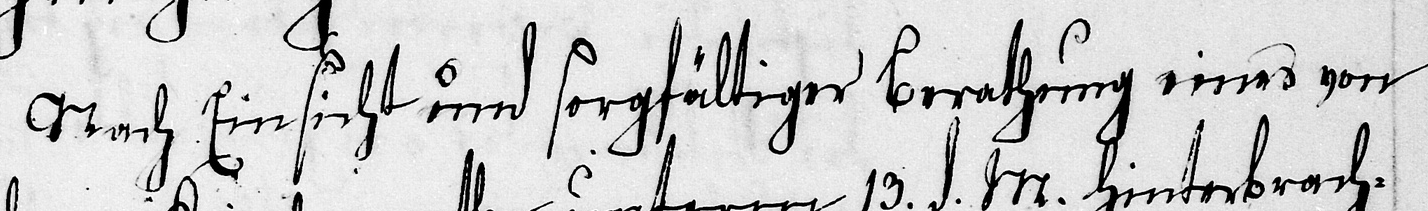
Nach Einsicht und sorgfältiger Berathung eines von
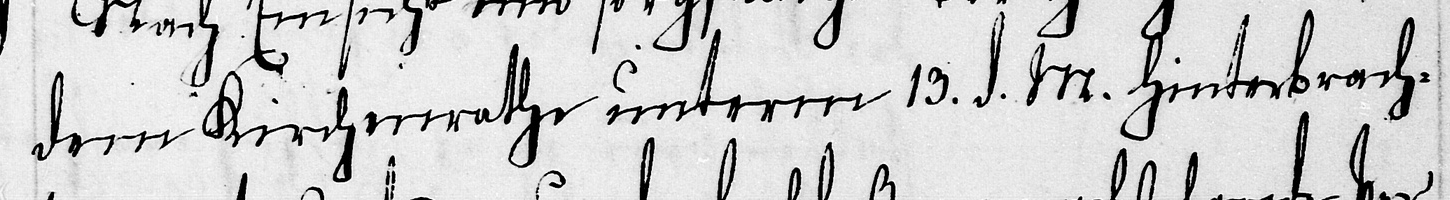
dem Kirchenrathe unterm 13. d. M. hinterbrach¬
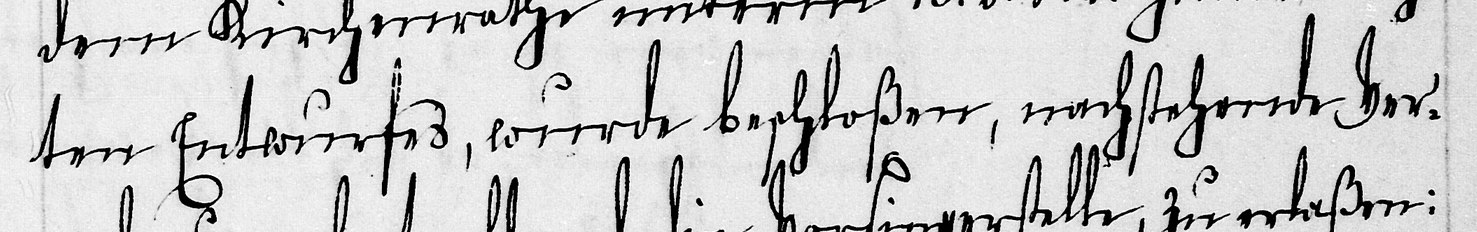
ten Entwurfes, wurde beschloßen, nachstehende Ver¬
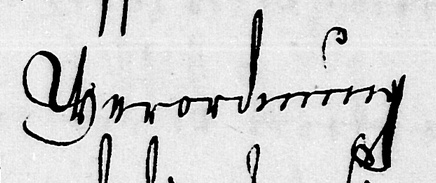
Verordnung
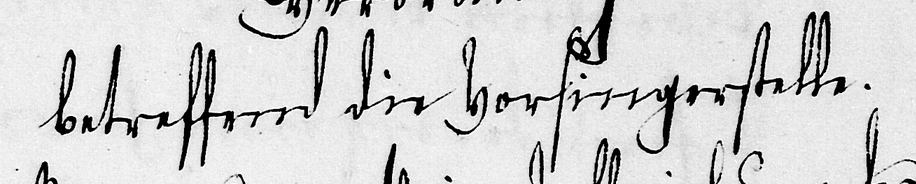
betreffend die Vorsingerstelle.
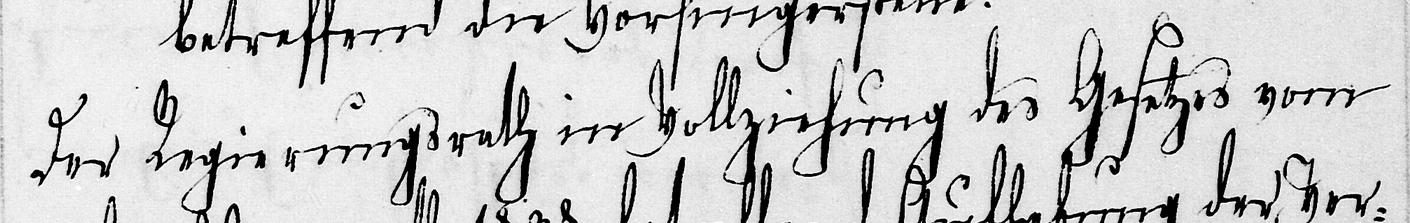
Der Regierungsrath in Vollziehung des Gesetzes vom
